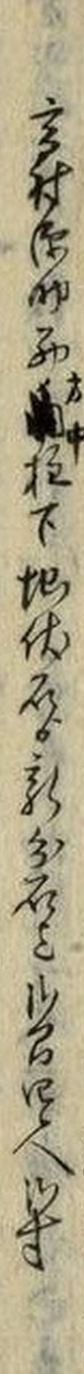高村源助西方中柱下地伏石ゟ新分石迄弐間四尺弐寸
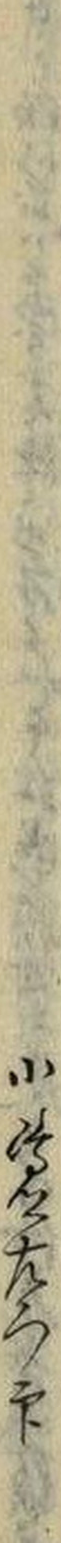小島郷左衛門印
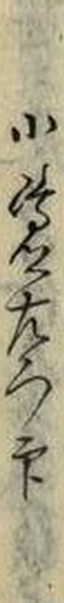小島郷左衛門印
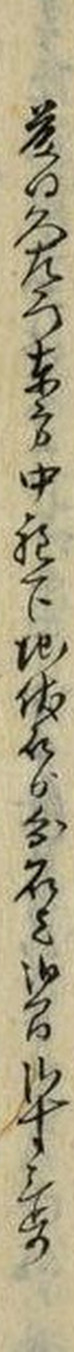藤田久左衛門東方中柱下地伏石ゟ分石迄弐間弐寸三歩
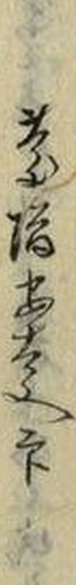慶増安大夫印
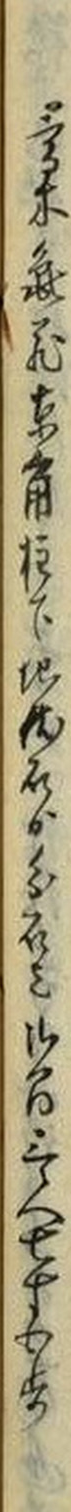高木亀蔵東角柱下地伏石ゟ分石迄弐間三尺七寸五歩
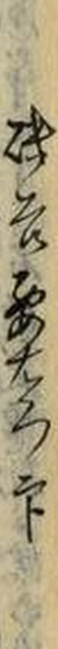磯谷要右衛門印
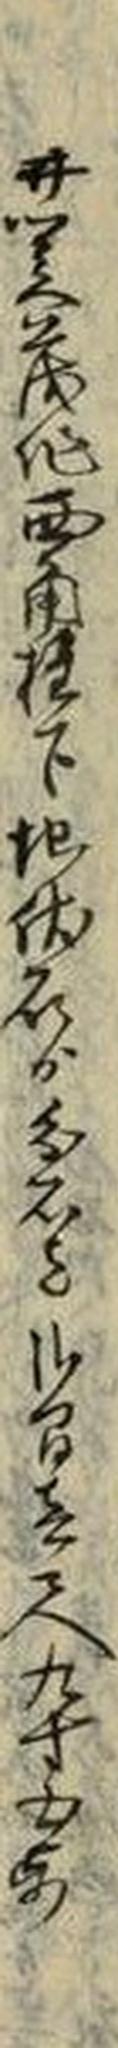井関茂作西角柱下地伏石ゟ分石迄弐間壱尺九寸五歩
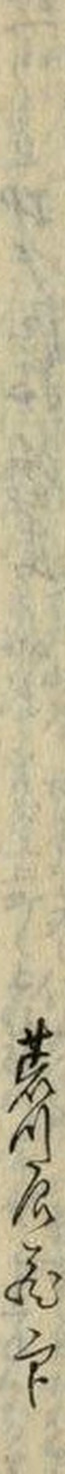荒川辰蔵印
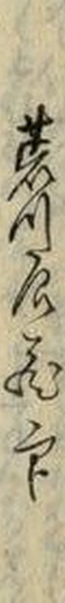荒川辰蔵印
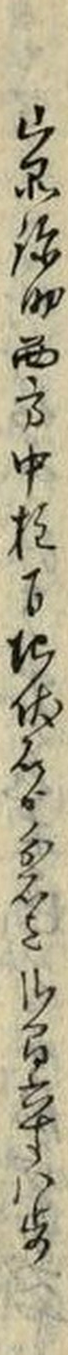山品弥助西方中柱下地伏石ゟ分石迄弐間六寸八歩
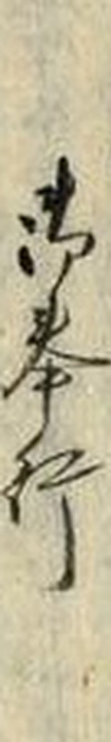御奉行
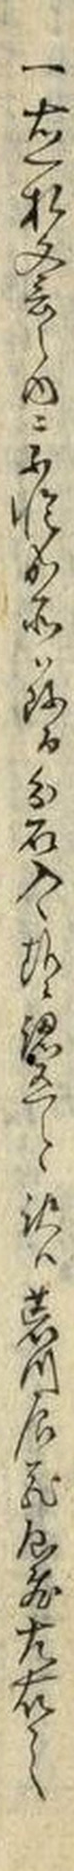一右一札文言之内に不慥成所は改て分石入候趣に認有之候訳は荒川辰蔵屋敷左右之
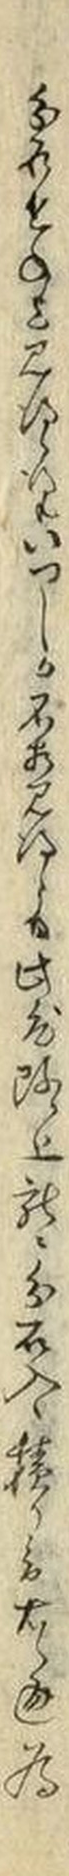分石近年迄見得候得共いつしか不相見得候付此度改候上新に分石入候積りにて右之通為
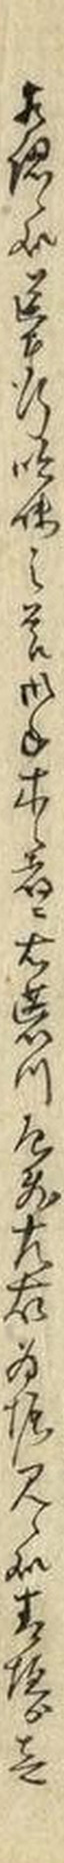相認候処道奉行吟味之節御手木之者に右荒川屋敷左右為堀見候処青垣ゟ壱
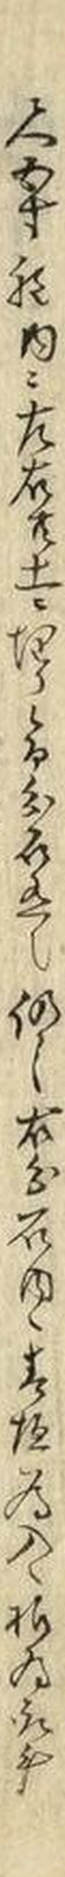尺五寸程内に左右共土に埋り候て分石有之仍之右分石内へ青垣為入候様為取斗
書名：御城下諸事之部
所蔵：福井県文書館 Fukui Prefectural Archives
